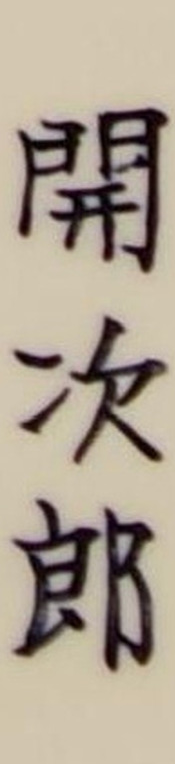開次郎
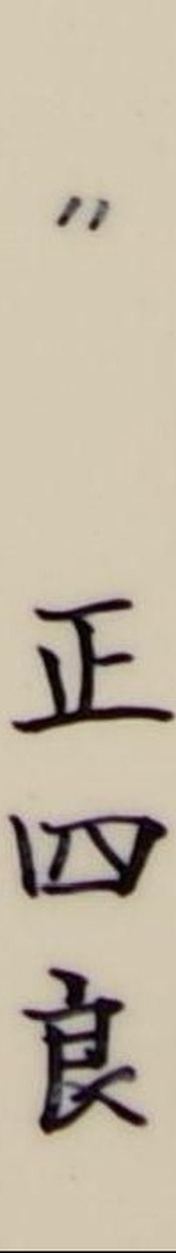正四良
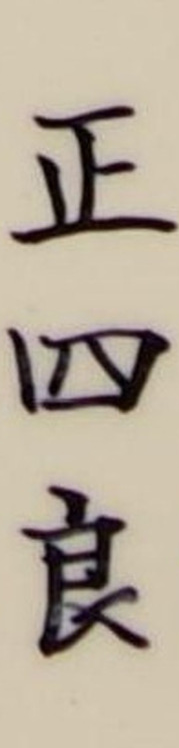正四良
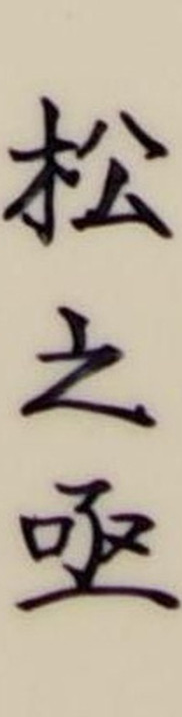松之丞
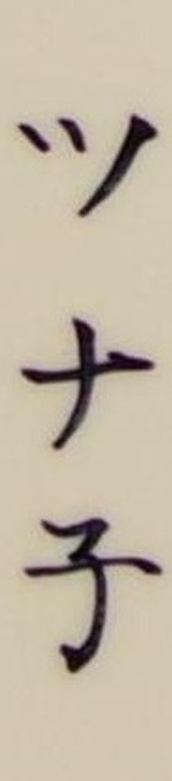ツナ子
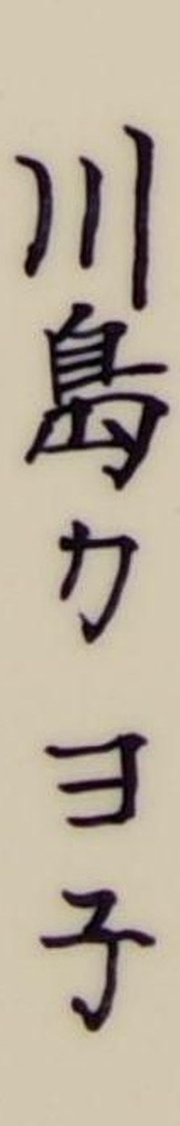川島カヨ子

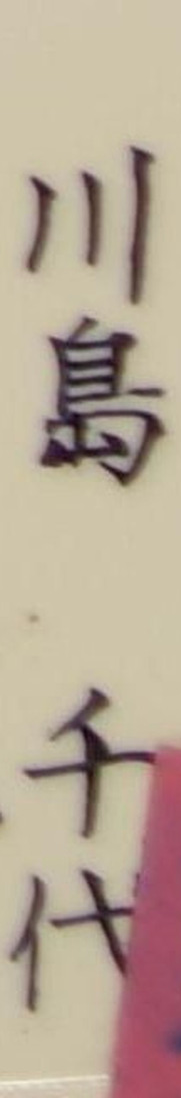川島千代
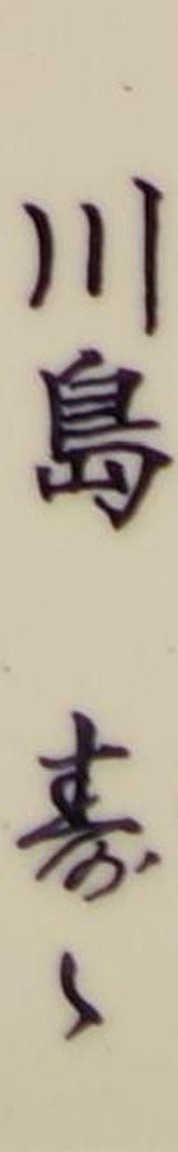川島寿々
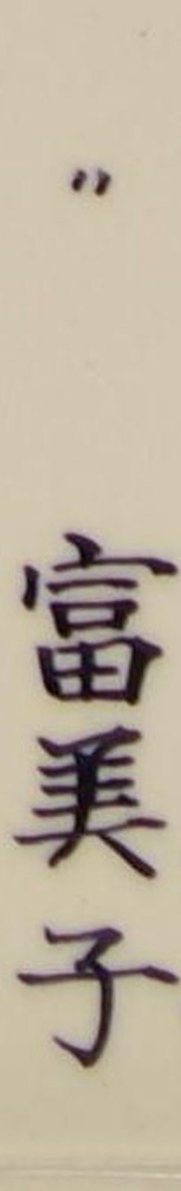富美子
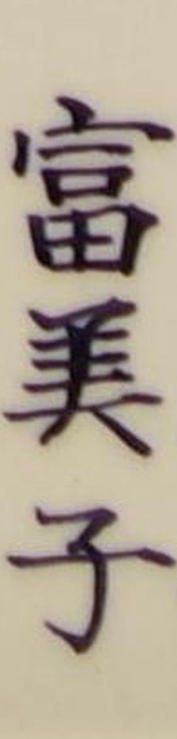富美子
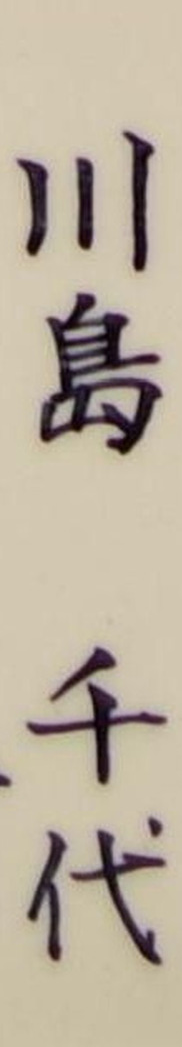川島千代
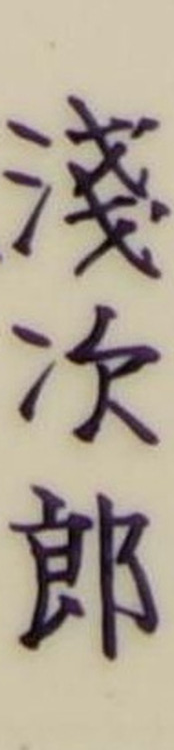浅次郎
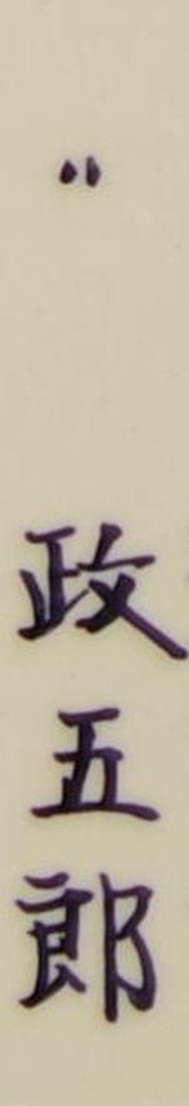政五朗
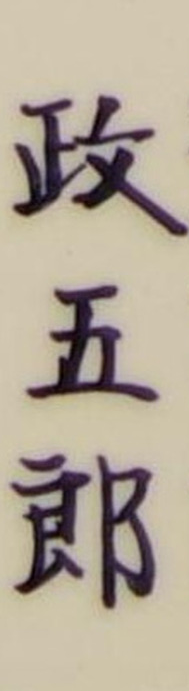政五朗
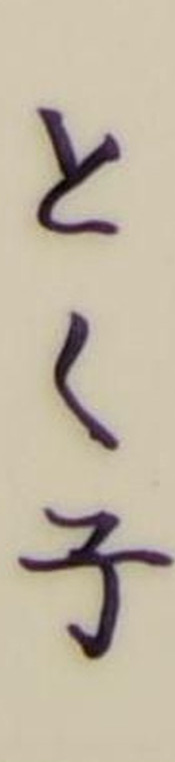とく子

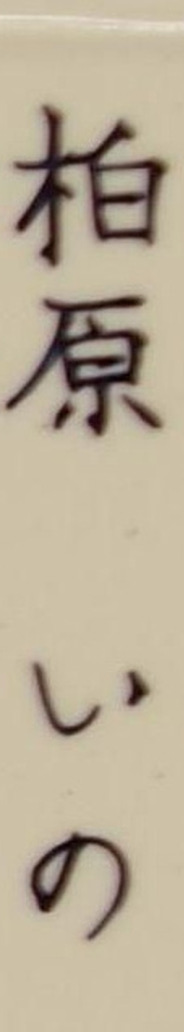柏原いの
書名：E~L
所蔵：高野山金剛峯寺
